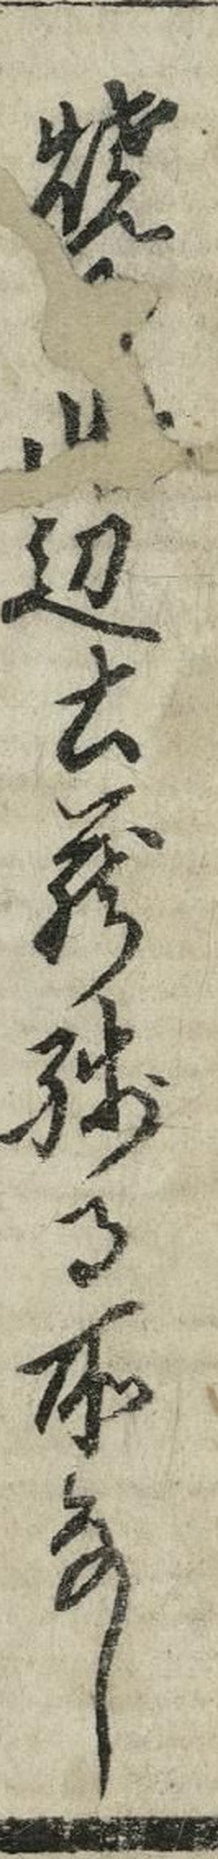焼る此辺土蔵残る所なし
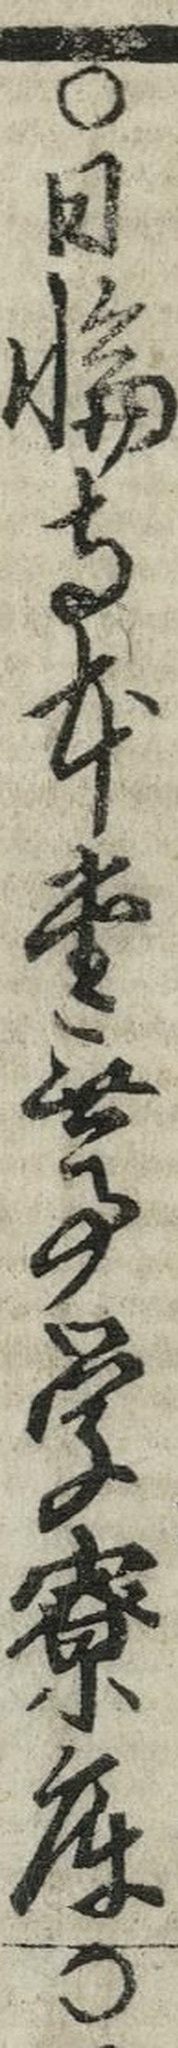○日輪寺本堂無事学寮庫
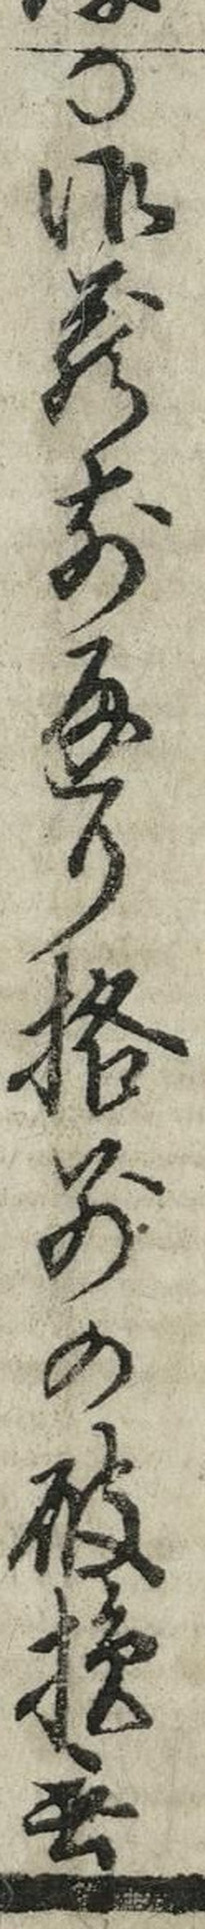○御蔵前通り格別の破損無
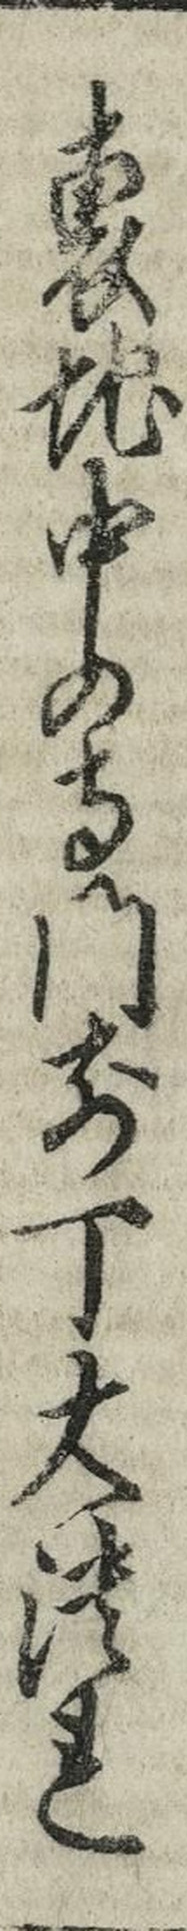裏地中の寺門前丁大潰れ
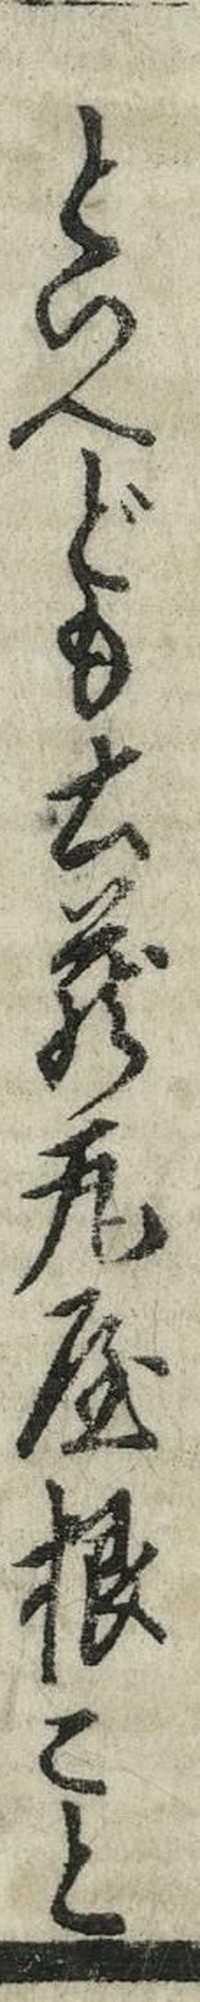といへども土蔵瓦屋根こと
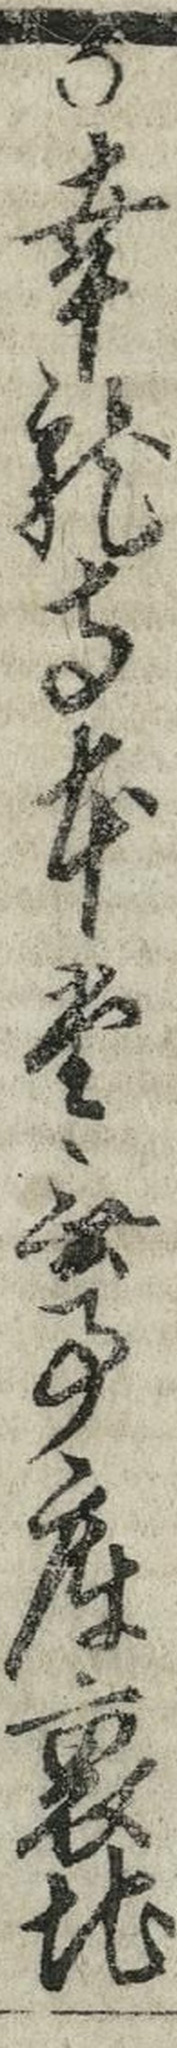○幸龍寺本堂無事庫裏地
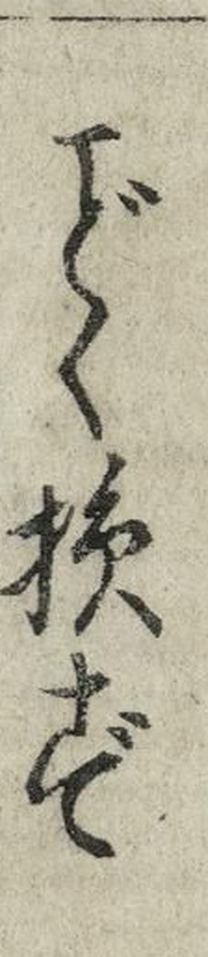ごとく損ず
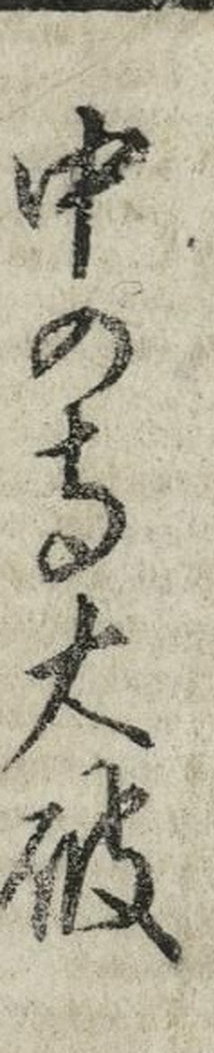中の寺大破
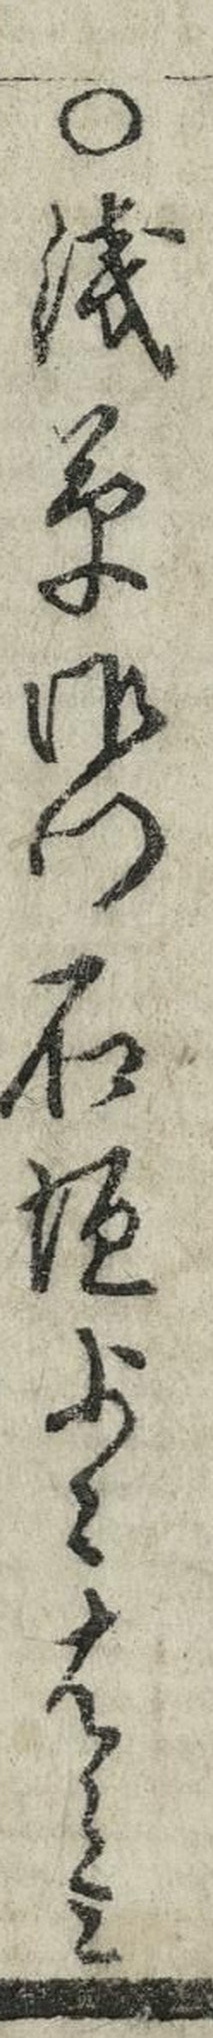○浅草御門石垣少々はらみ
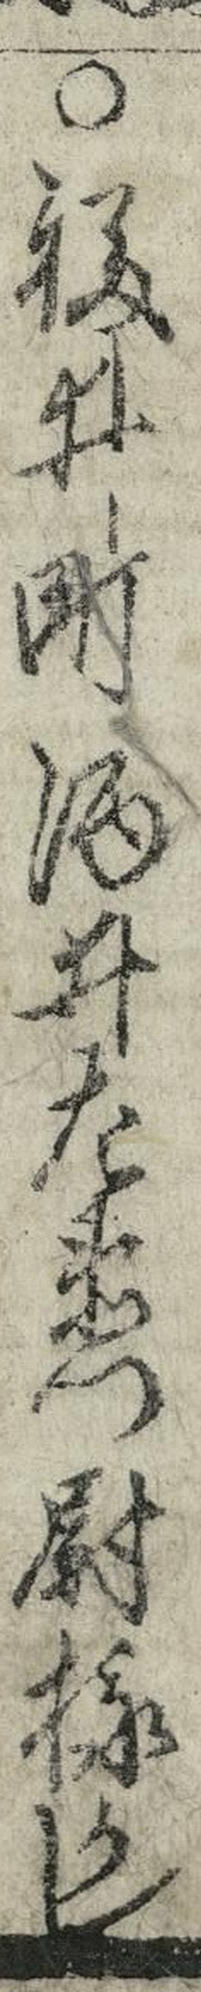○福井町酒井左衛門尉様かし
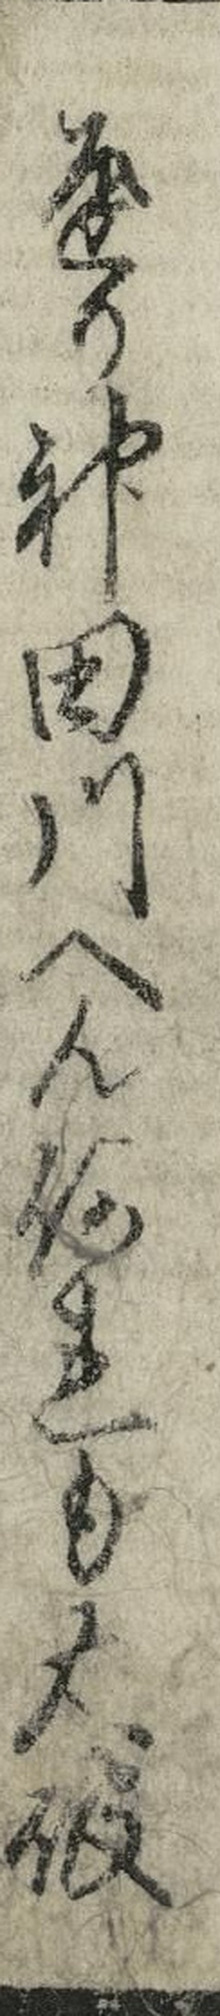通り神田川へん何れも大破

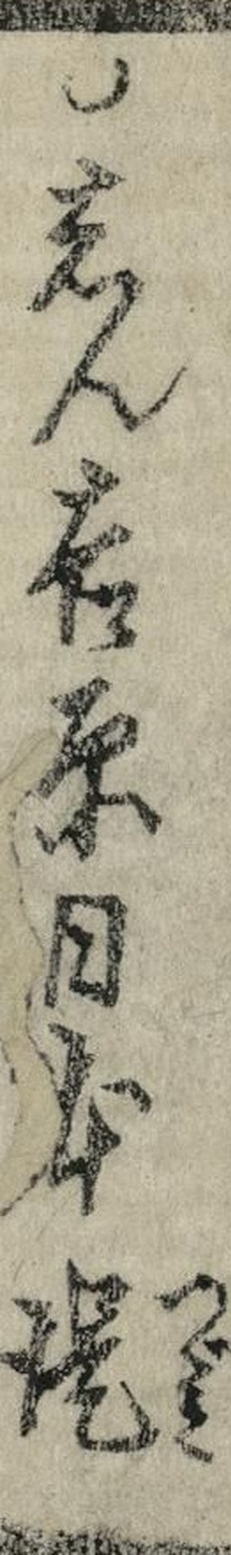○しん吉原日本堤
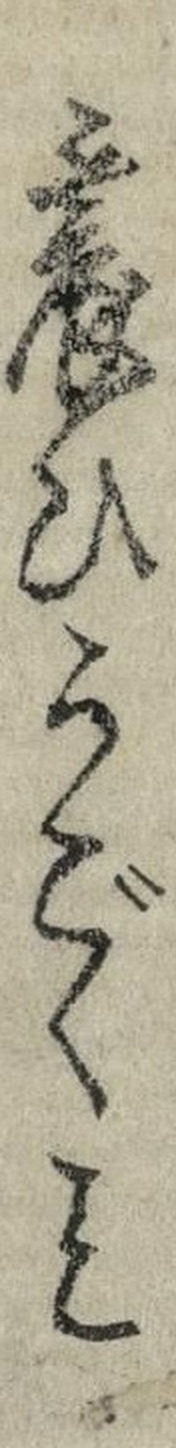震ひうごくこと
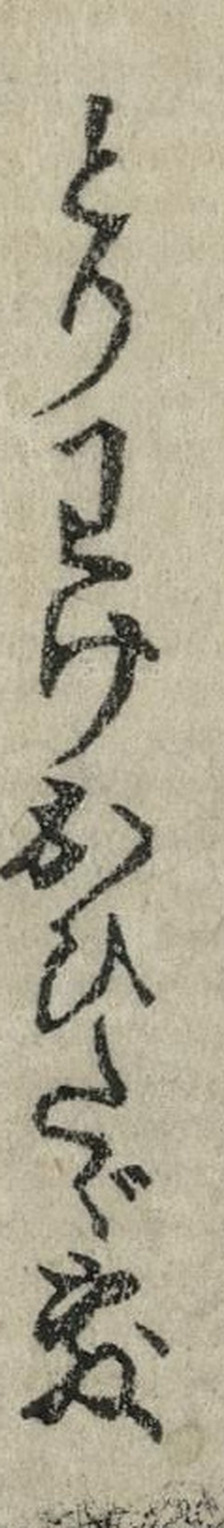とりわけおひたゞ敷
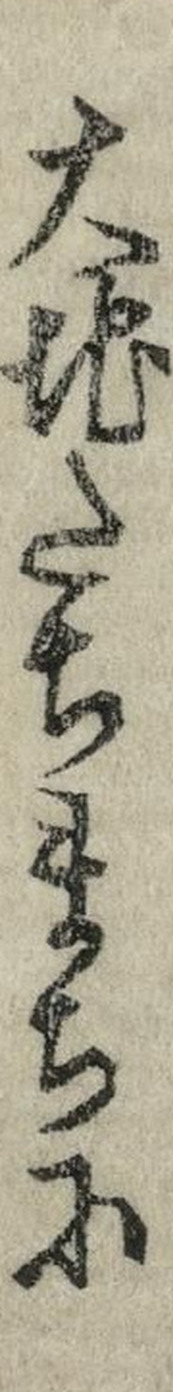大地たちまちに
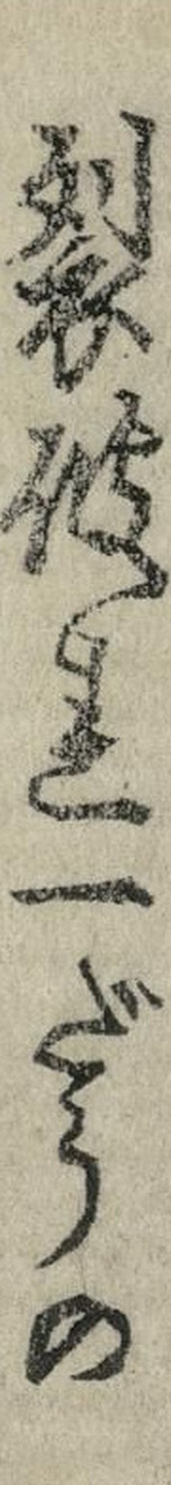裂破れ一だうの
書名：江戸　大地震末代噺の種　全
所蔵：東京大学地震研究所図書室 Earthquake Research Institute Library, The University of Tokyo, JAPAN
